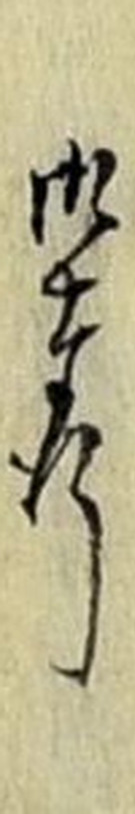御奉行
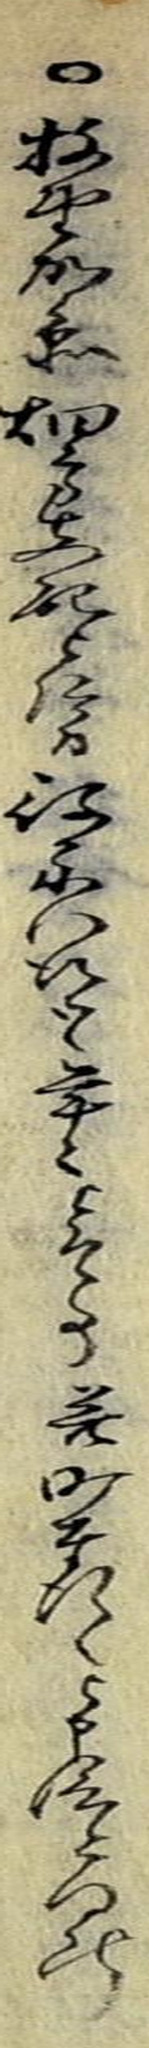○牧野加兵衛畑方支配被仰付役米八取つヽ年々被下候事并町奉行へ被申渡と同断
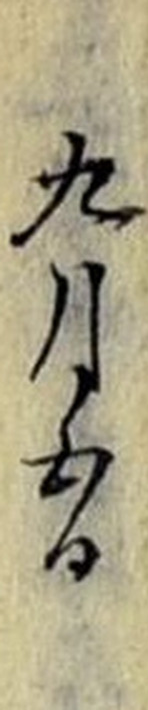九月五日
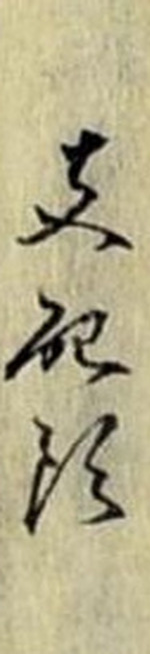支配頭
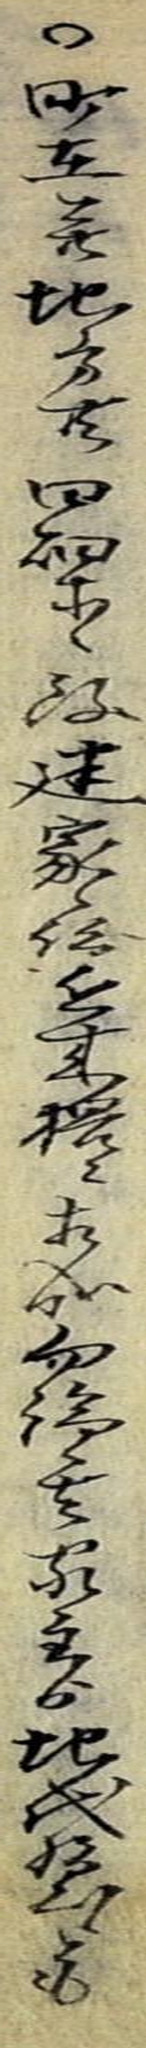○町在并地方共田畑等へ致建家候儀近来猥に相成勿論其家主ゟ地代指出候とも
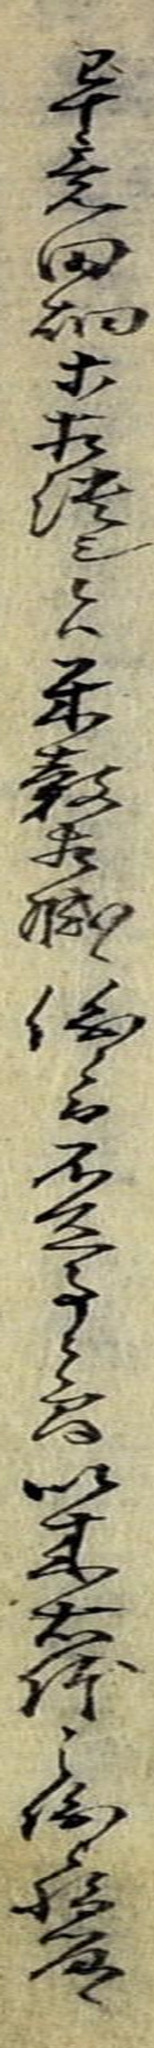畢竟田畑等相潰しには米穀相減候儀に而不宜事に候間以來右体之儀被指留候
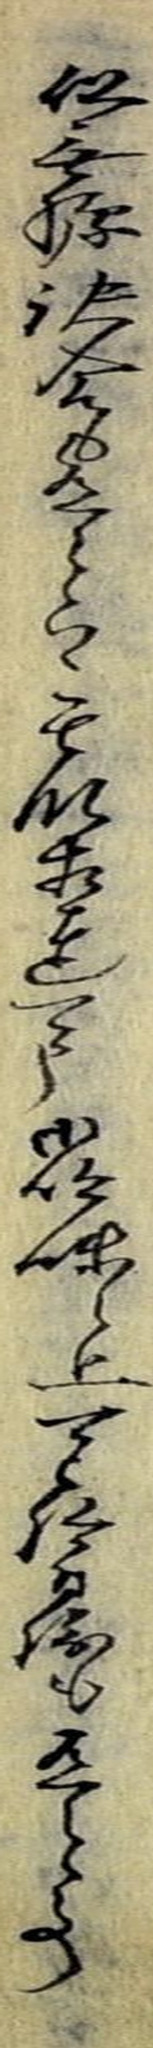但無拠訳合も有之候はヽ其段相達可申御吟味之上可被仰付儀も有之候事
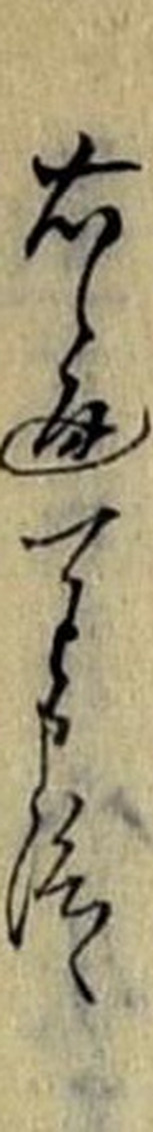右之通可被申渡候
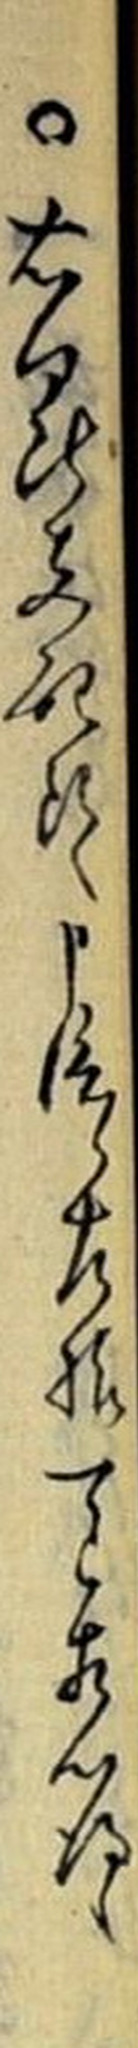○右同断支配頭へ申渡候左様可被相心得候
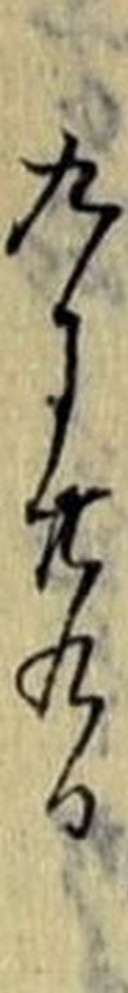九月廿九日
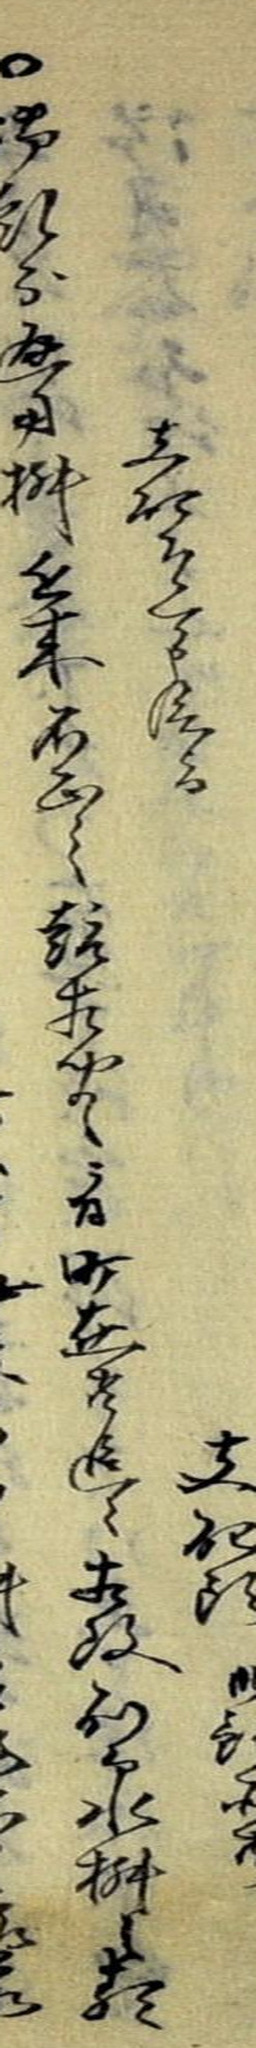○御領分通用枡近来不正之趣相聞候に付町在共に追々相改別而水枡之類
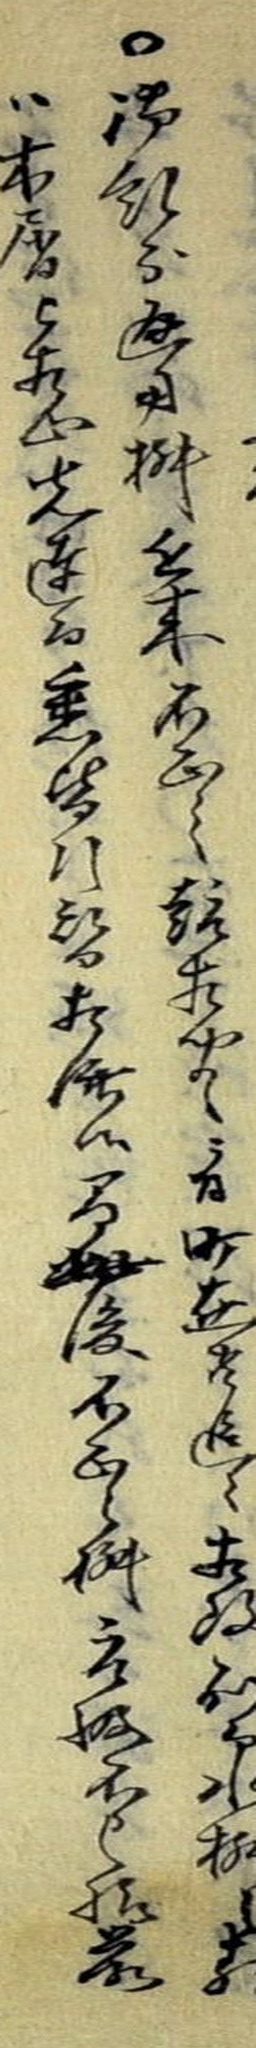は木屑被相止先達而悉皆引替相済候間此後不正之枡取扱不申樣厳
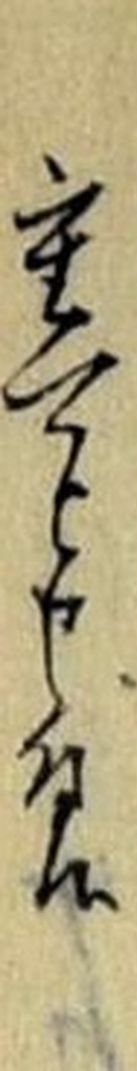重可被申付候
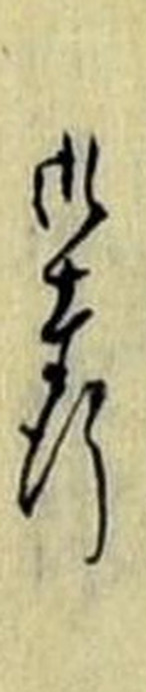御奉行
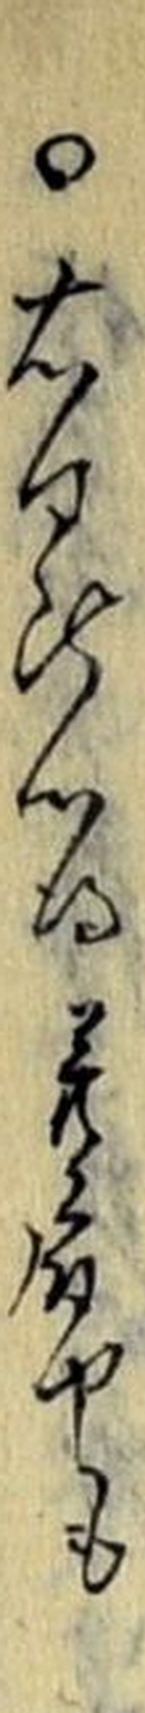○右同断心得并府中へも
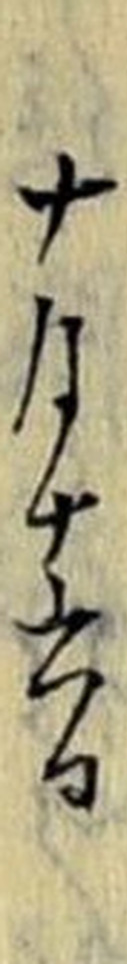十月十六日
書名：命令之部 六
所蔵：福井県文書館 Fukui Prefectural Archives
